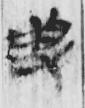受
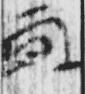○（期）
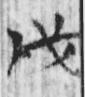戊
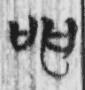申
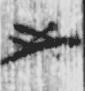之
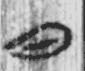日
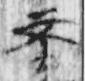不
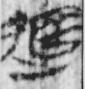𬨭（將）
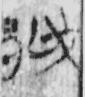○（越）
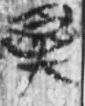異
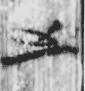之
